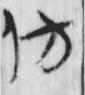仿
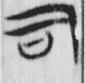司
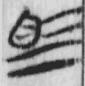馬
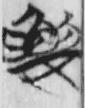婁
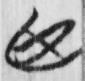臣
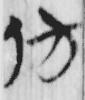仿
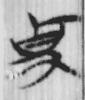史
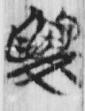婁
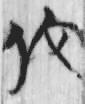佗
